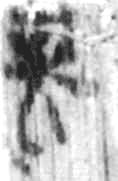長
